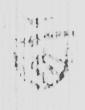百
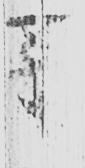{五十}
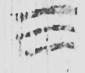三
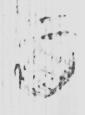百
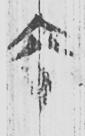{六十}
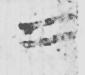二
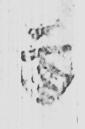百
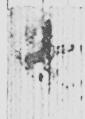七十=
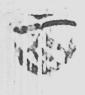百
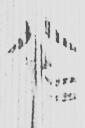八十=
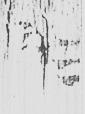九十=
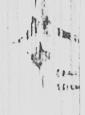八十=
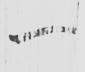一
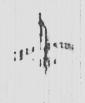七十
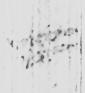二
